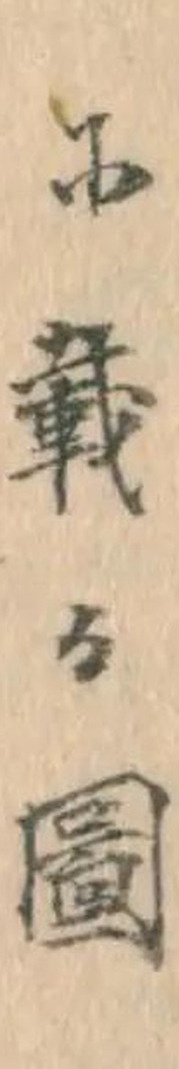に載る図
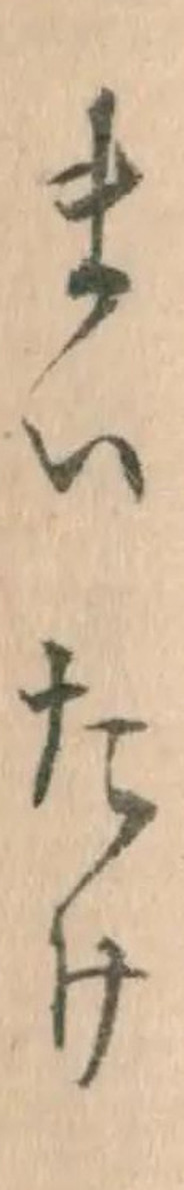まいたけ
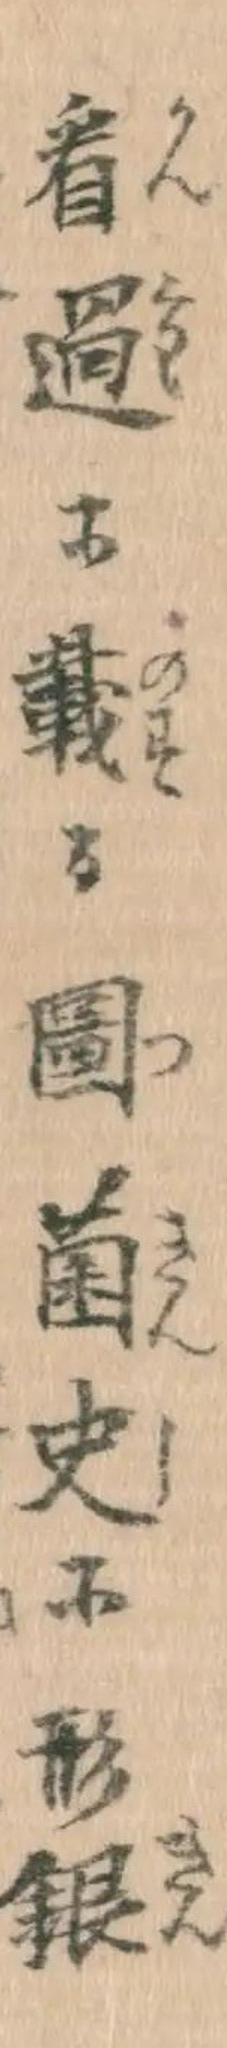看過に載る図菌史に形銀
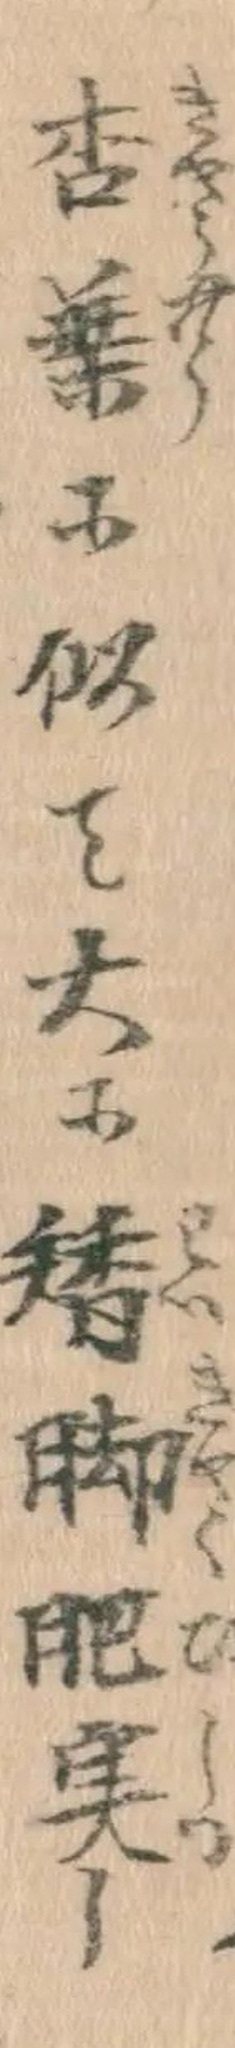杏葉に似て大に矮脚肥実し
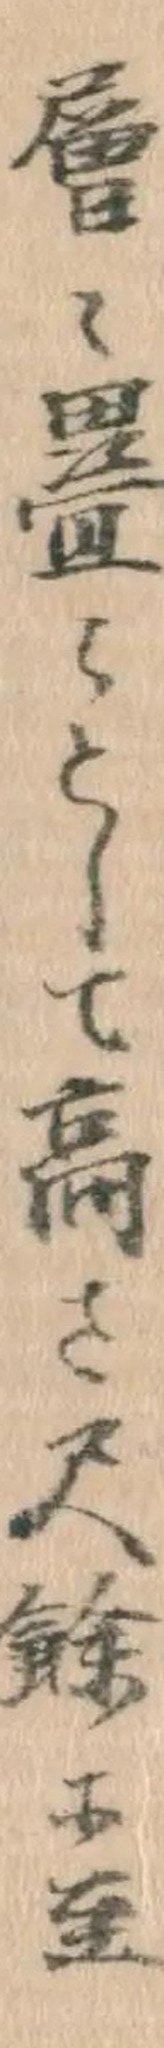層々畳々として高さ尺余に至
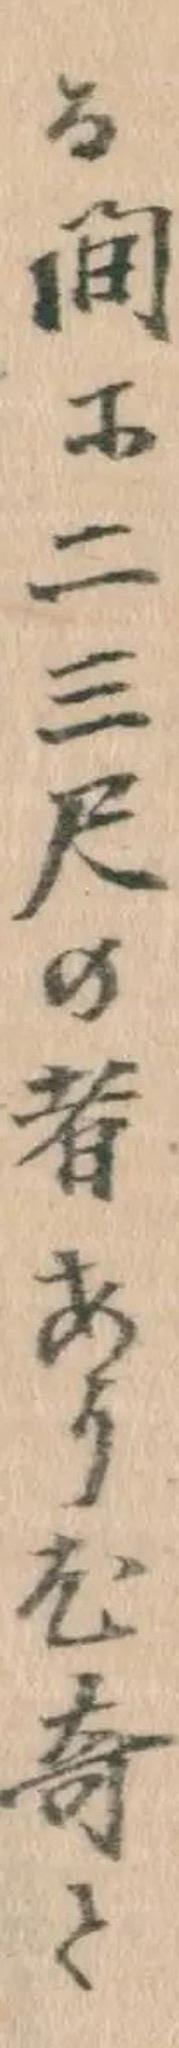る間に二三尺の者あり尤奇と
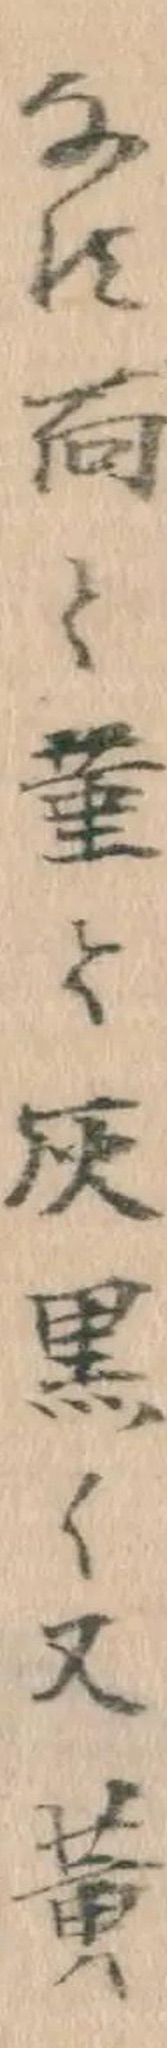なす面と茎と灰黒く又黄
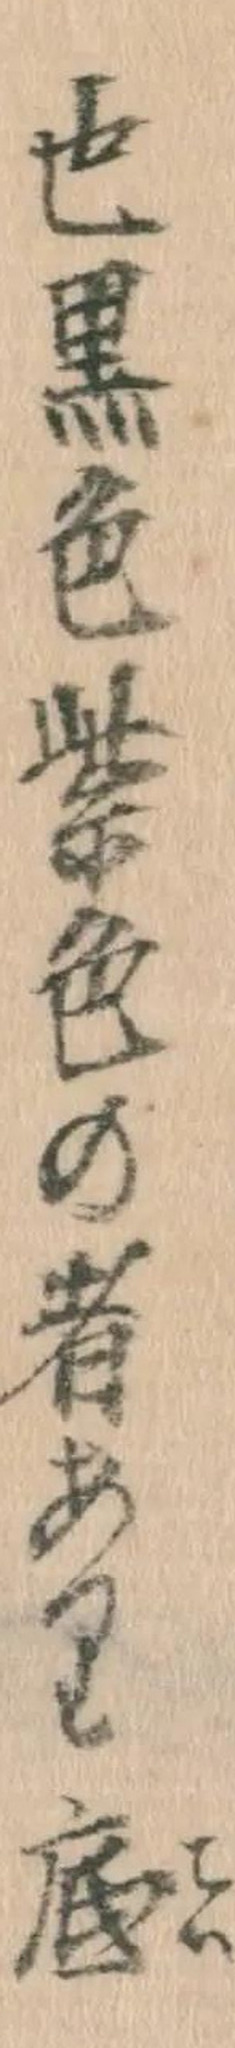也黒色紫色の者あり底
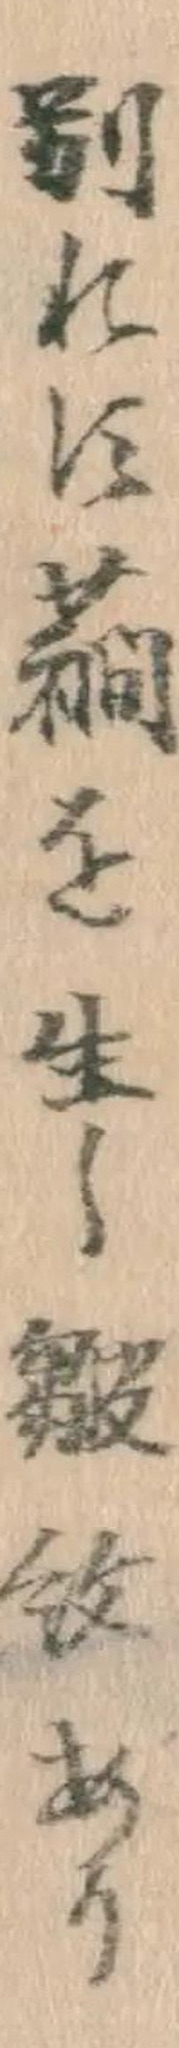別れすを生し皺紋あり
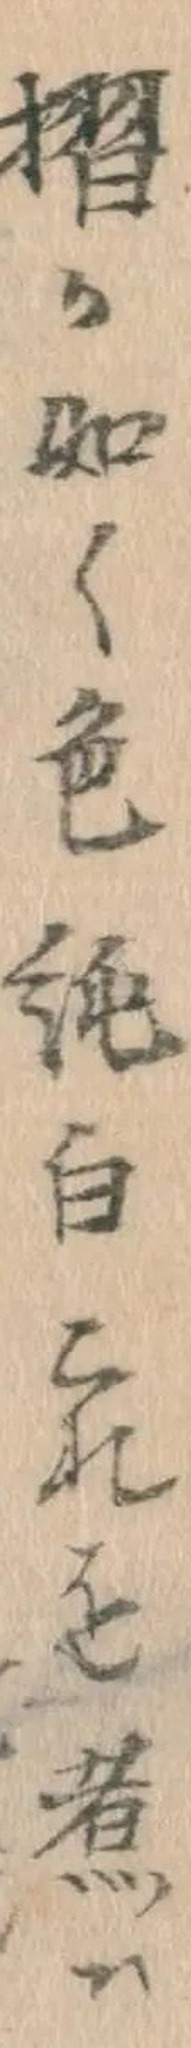摺か如く色純白これを煮は
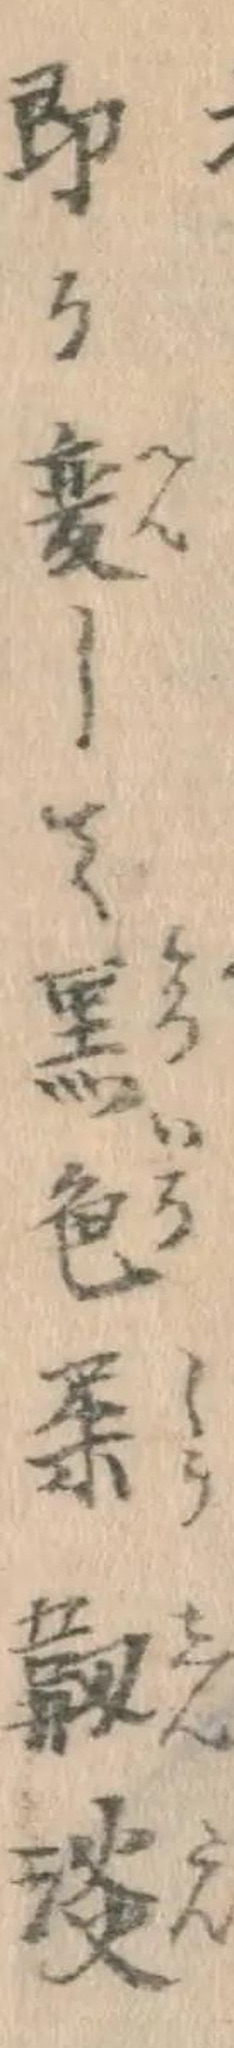即ち変して黒色柔韌淡
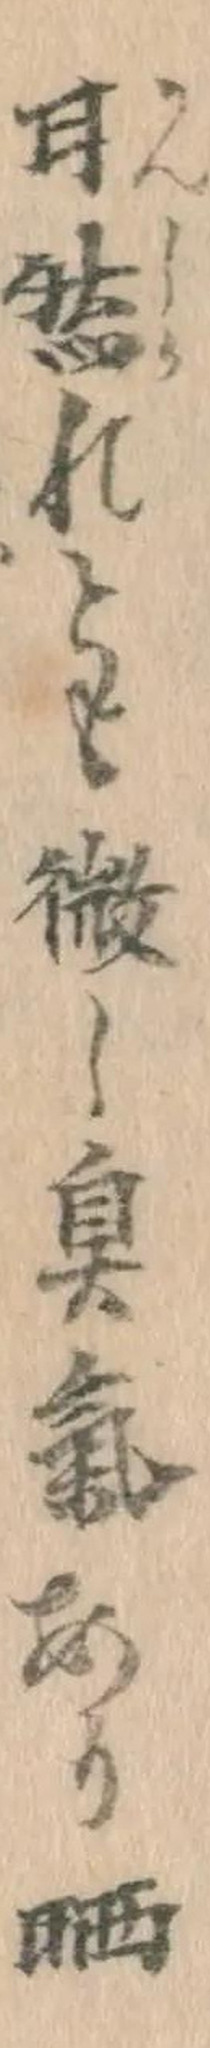甘然れとも微し臭気あり晒
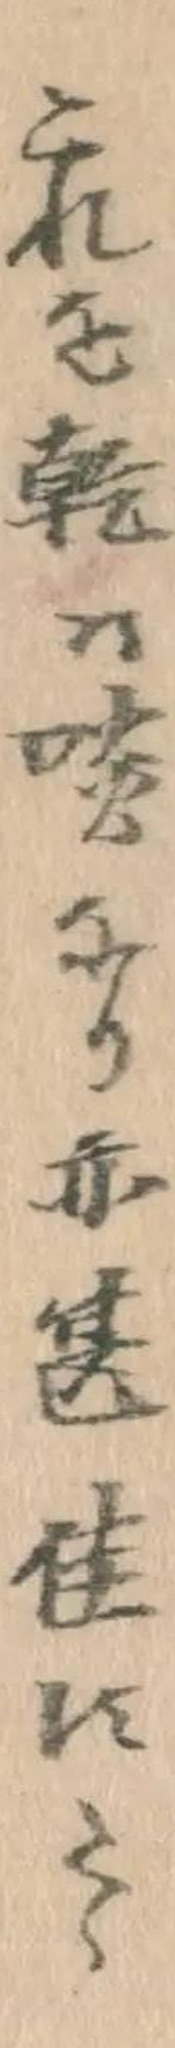これを乾は啖なり亦甚佳すたゝ
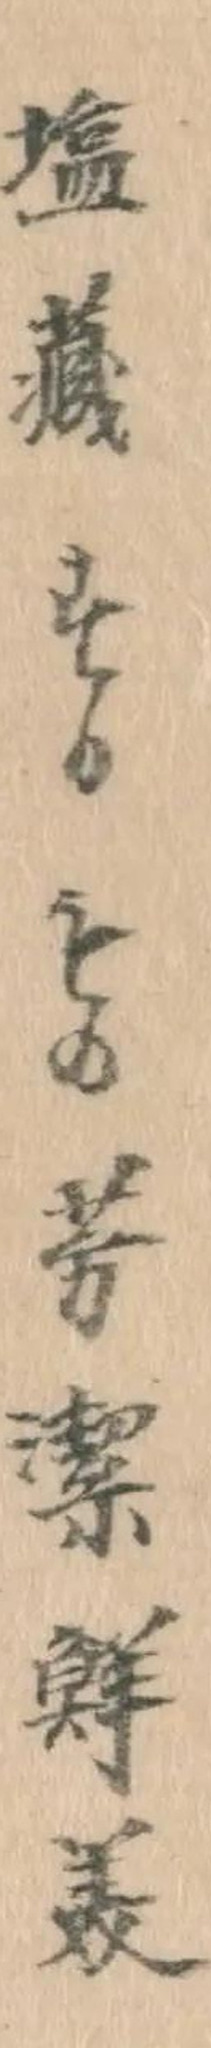塩蔵するもの芳潔鮮美
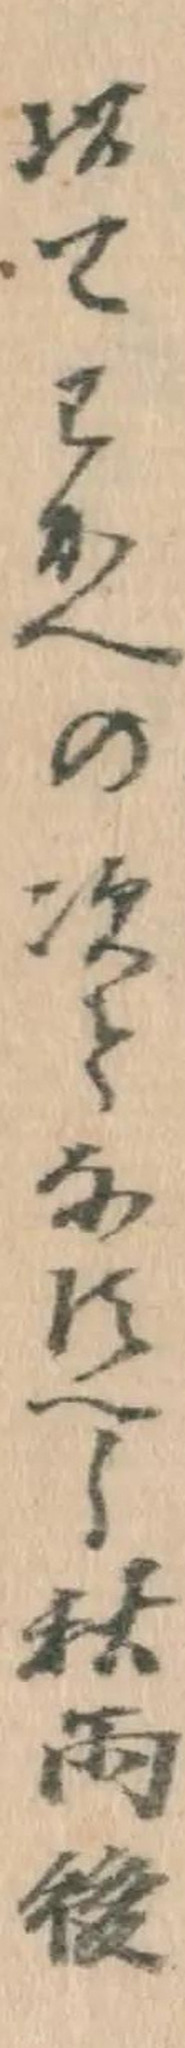以てわかへの次となすへし秋雨後
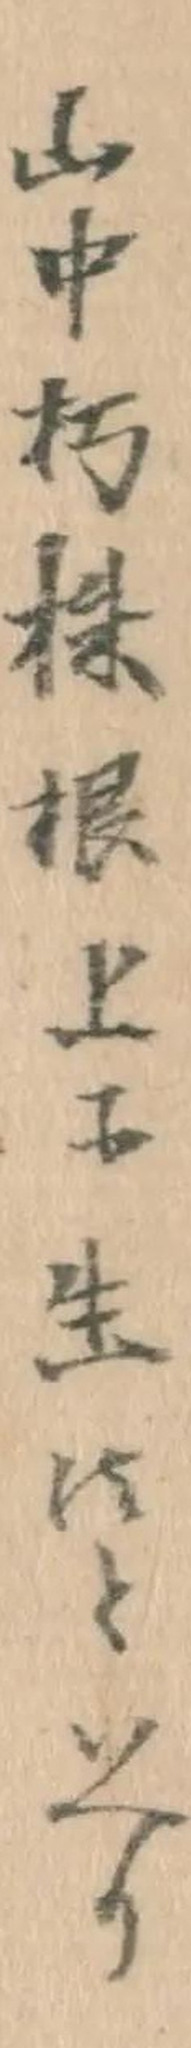山中朽株根上に生すといへり
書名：本草図譜. 巻58-60
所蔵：国立国会図書館 National Diet Library, JAPAN
